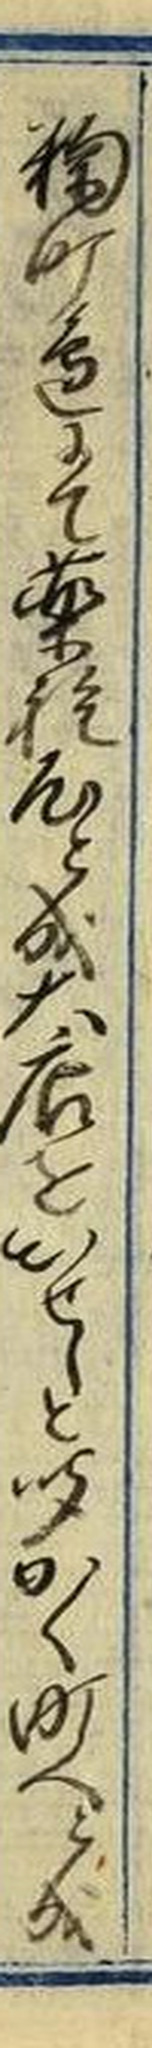麹町辺にて薬種屋と成大店を出せしと聞かく町人に成
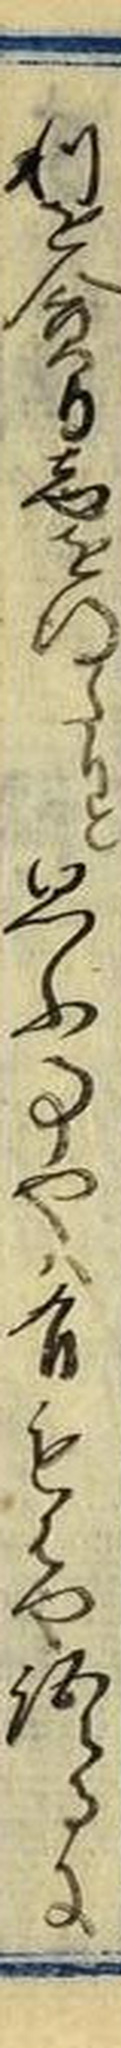利を貪り志を得たりと思ふ事やは有もはや語るに
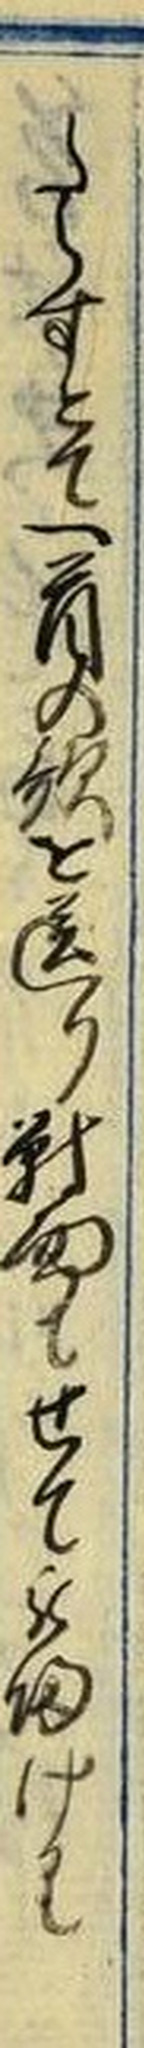たらすとて一首の歌を送り対面もせて被帰けり
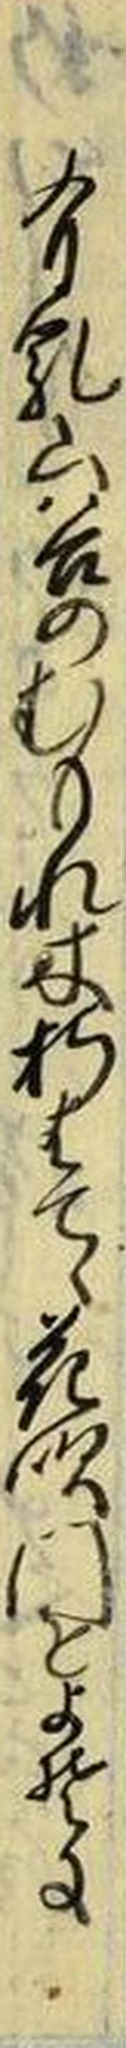有乳山谷のむもれ木朽はてゝ花吹門をよそに
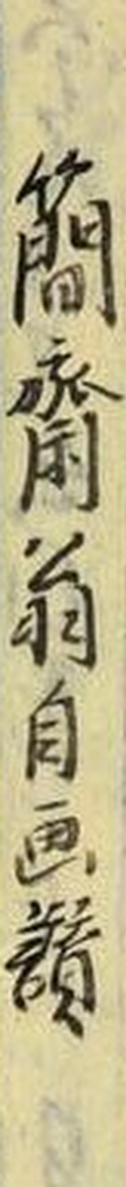簡齋翁自画讃
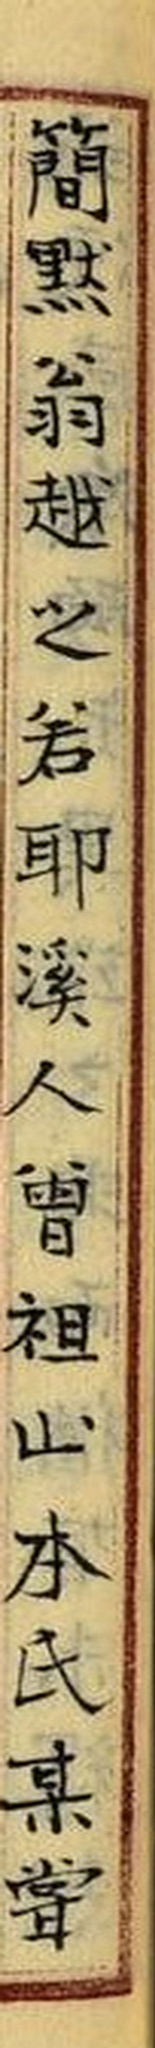簡黙翁越之若耶渓人曾祖山本氏某嘗
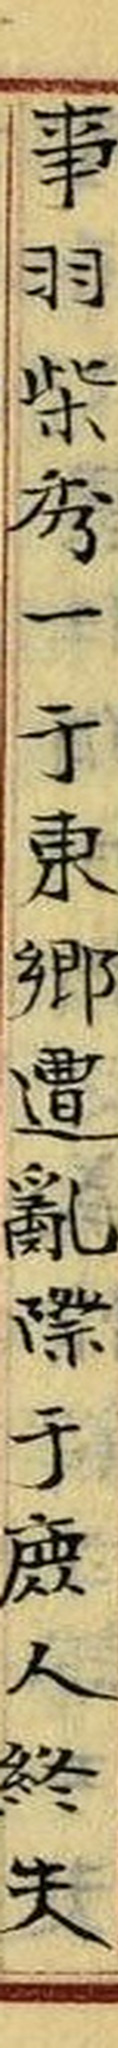事羽柴秀一于東郷遭亂際于鹿人終失
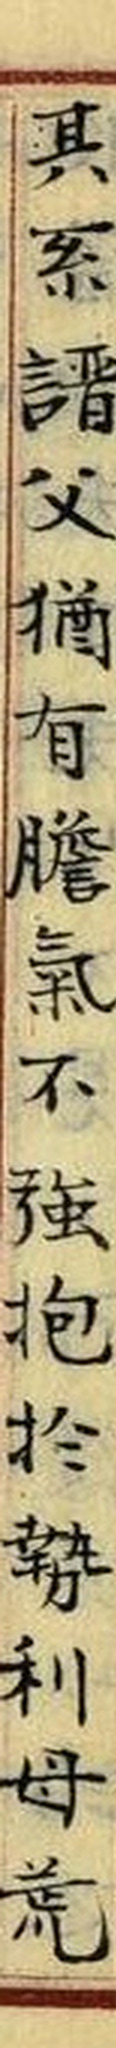其系譜父猶有膽氣不強抱於勢利母荒
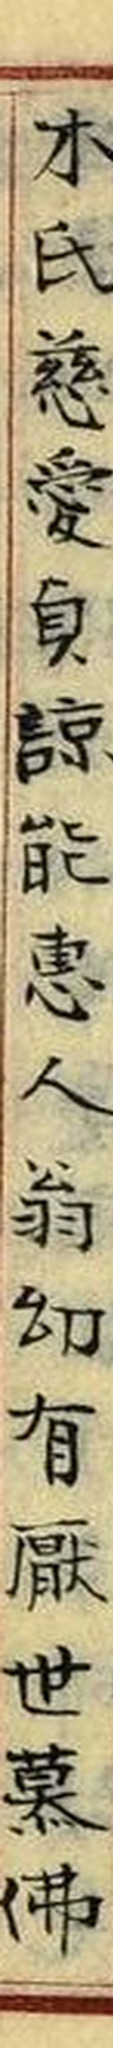木氏慈愛貞諒能恵人翁幼有厭世慕佛
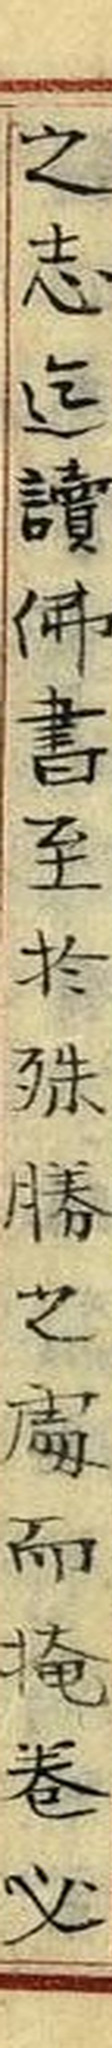之志迄讀佛書至於殊勝之處而掩巻必
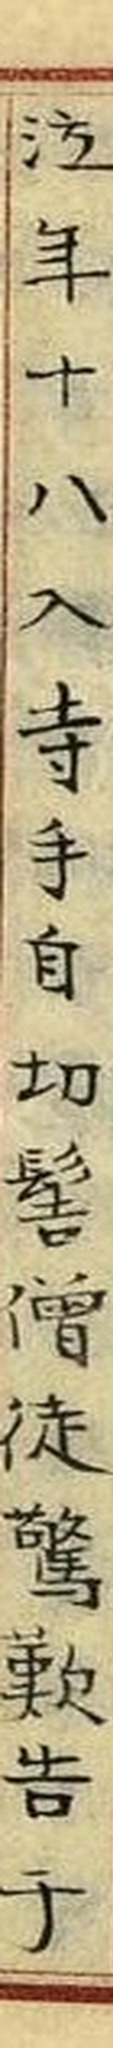泣年十八入寺手自切髻僧徒驚歎告于
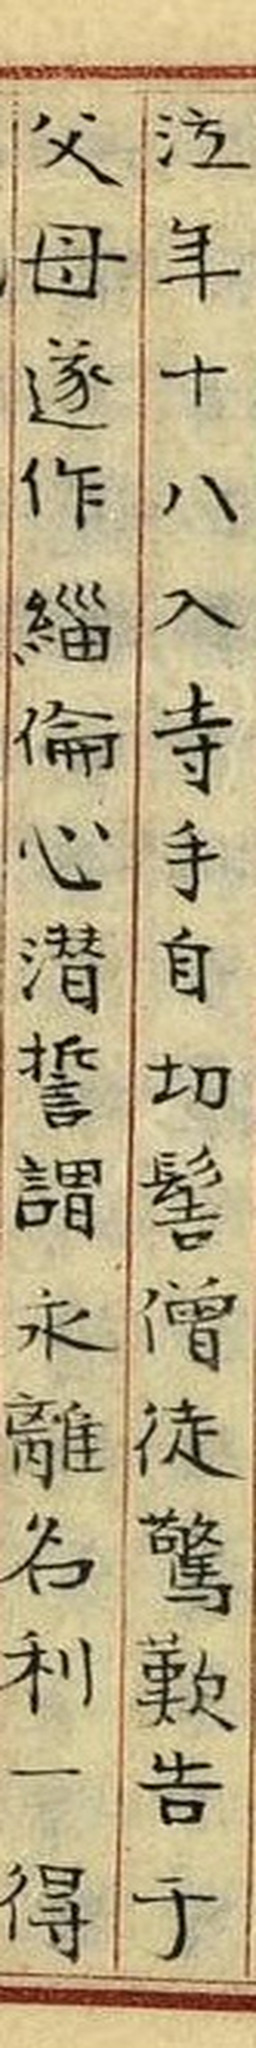父母遂作緇倫心潜誓謂永離名利一得
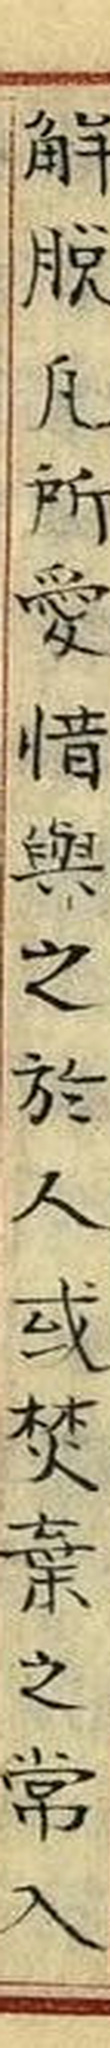解脱凡所愛惜與之於人或焚葉之常入
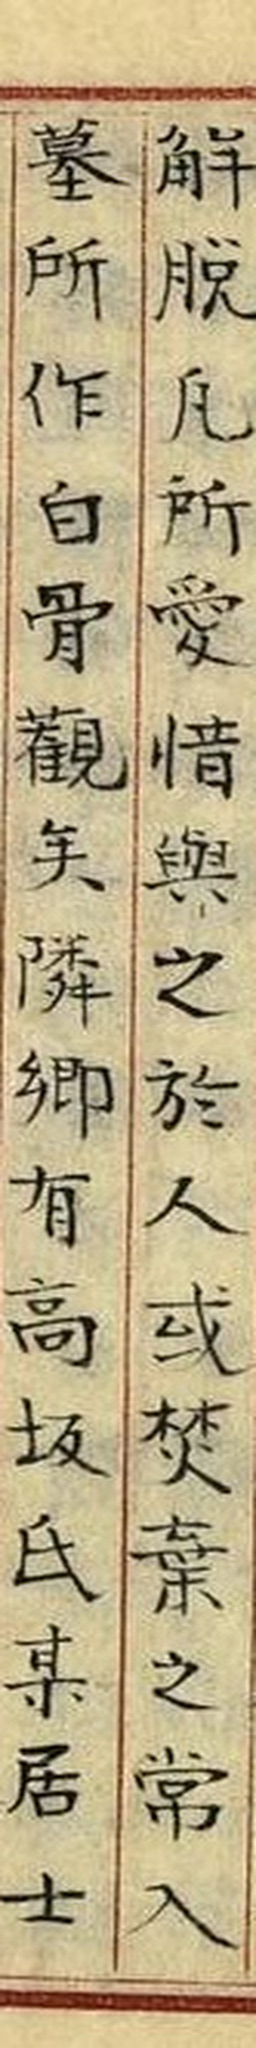墓所作白骨觀矣隣郷有高坂氏某居士
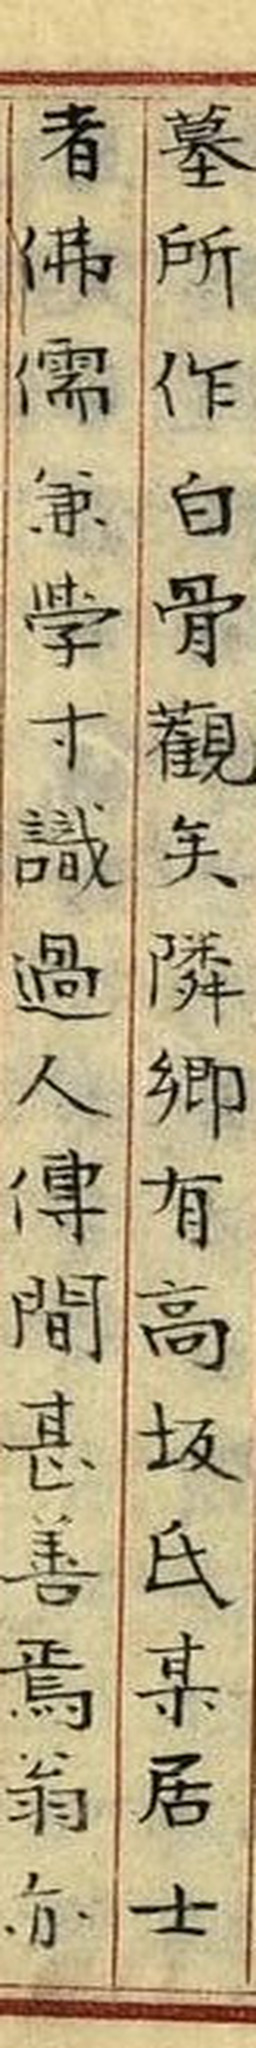者佛儒兼學寸識過人傳間甚善焉翁亦
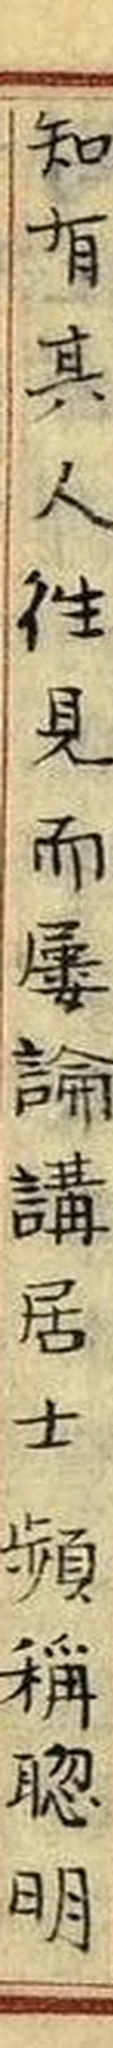知有其人往見而屢論講居士頻稱聦明
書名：温古集 四巻
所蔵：福井県文書館 Fukui Prefectural Archives
